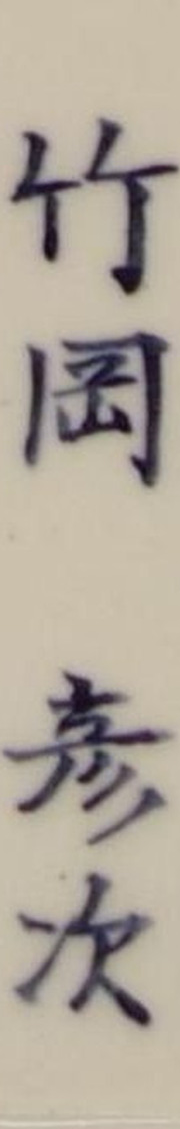竹岡彦次
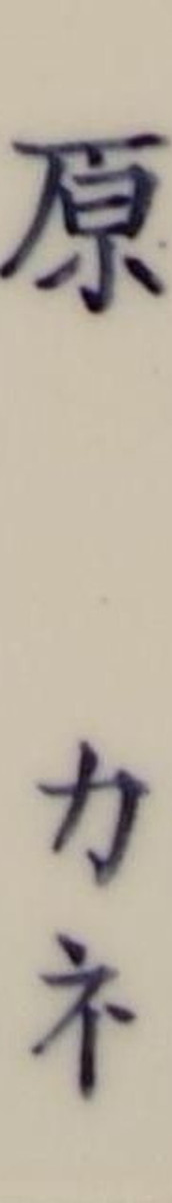原カネ
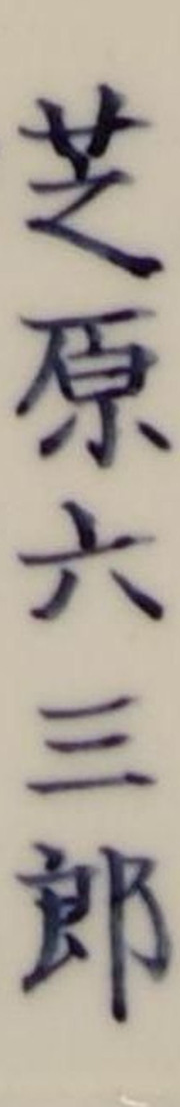芝原六三郎
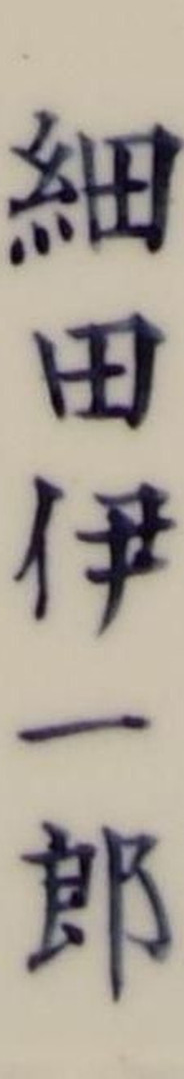細田伊一郎
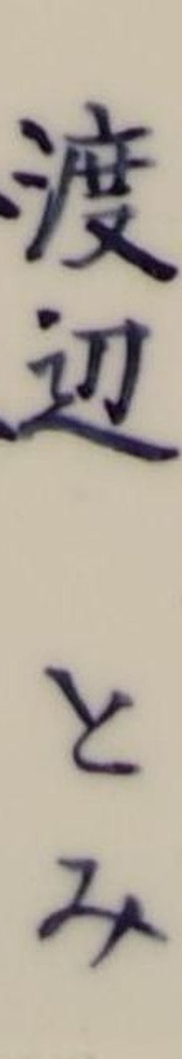渡辺とみ
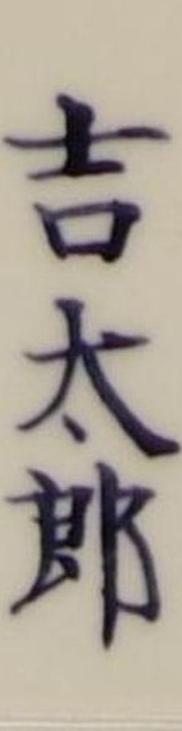吉太郎
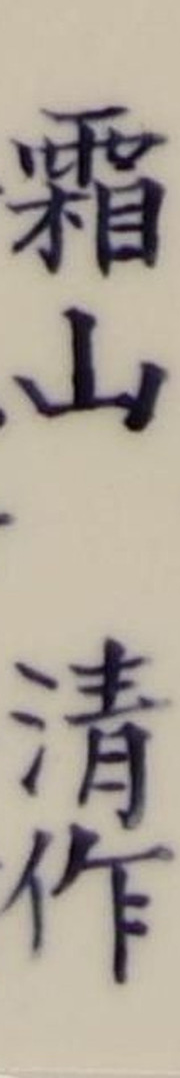霜山清作
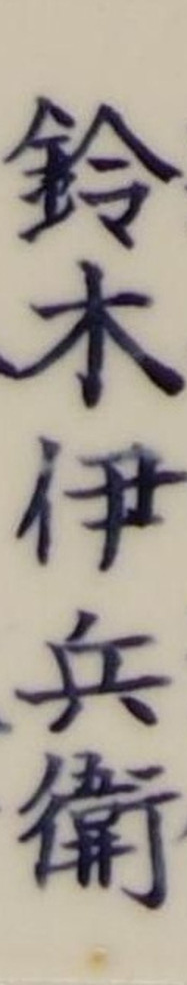鈴木伊兵衛
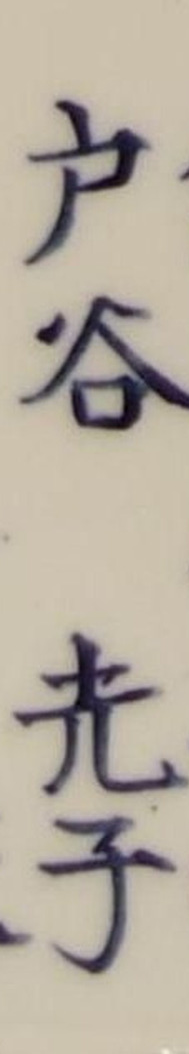戸谷光子
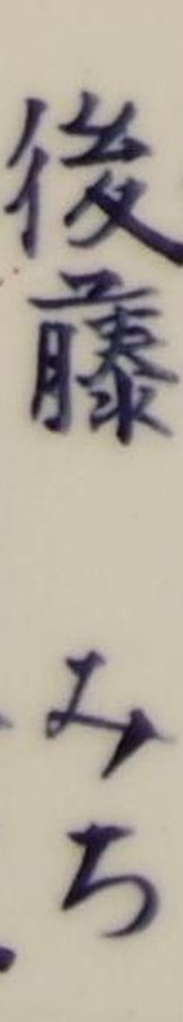後藤みち
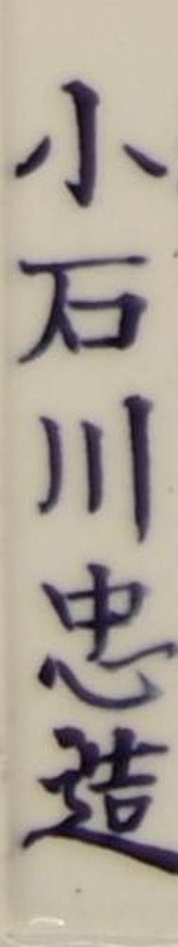小石川忠造

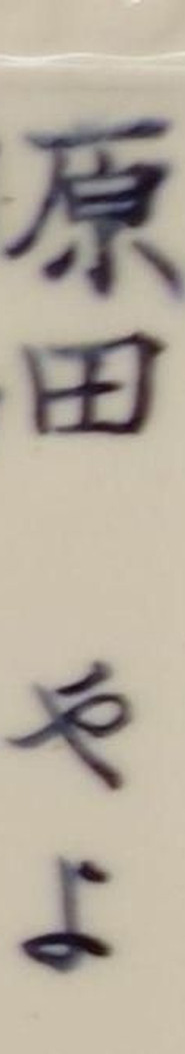原田やよ
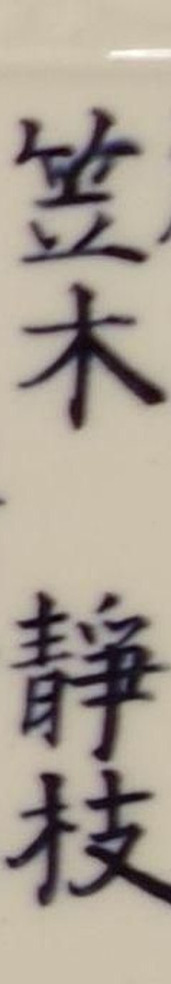笠木静枝
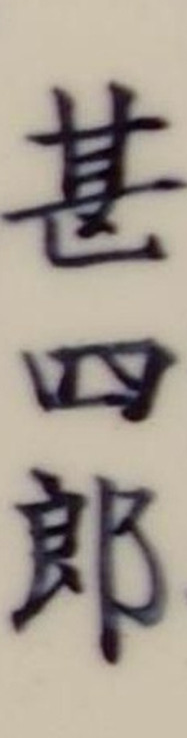甚四郎
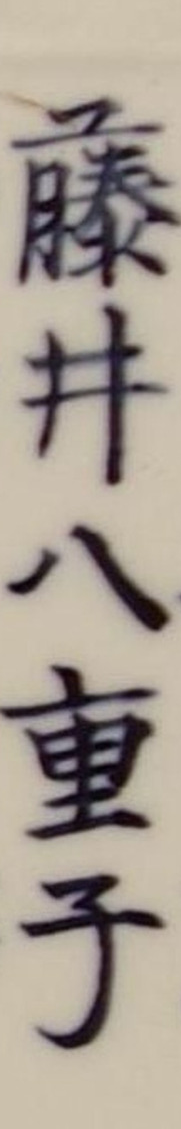藤井八重子
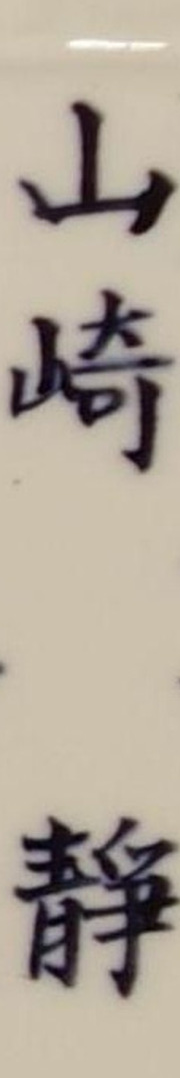山崎静
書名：E~L
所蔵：高野山金剛峯寺
